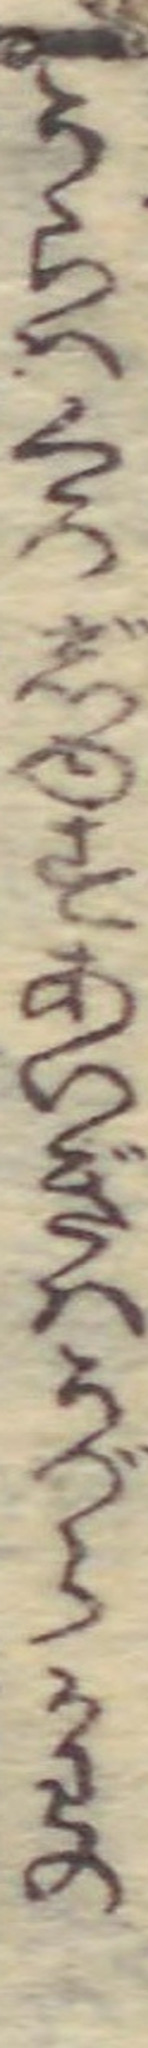うらはくろじゆすあいぎはうづらかわの
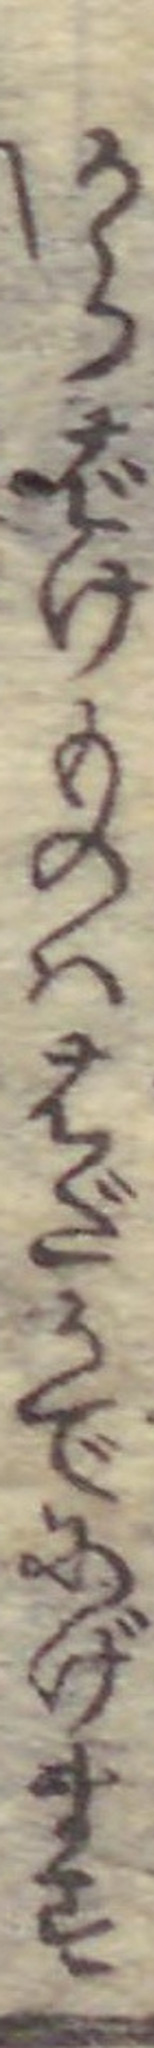からばけものははだかでにげます
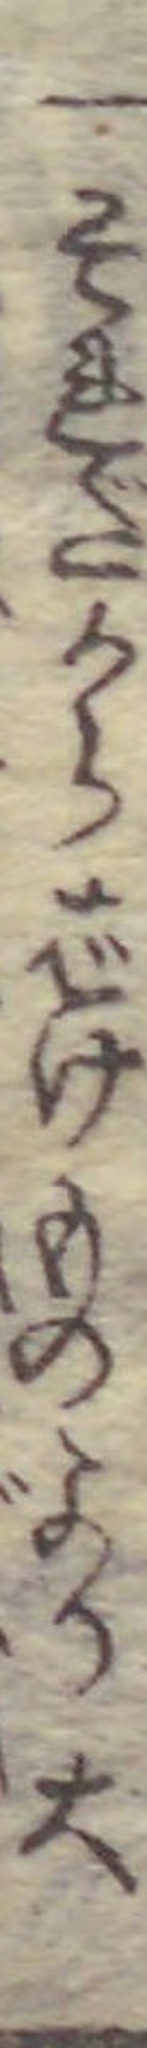〽それだからばけものより大
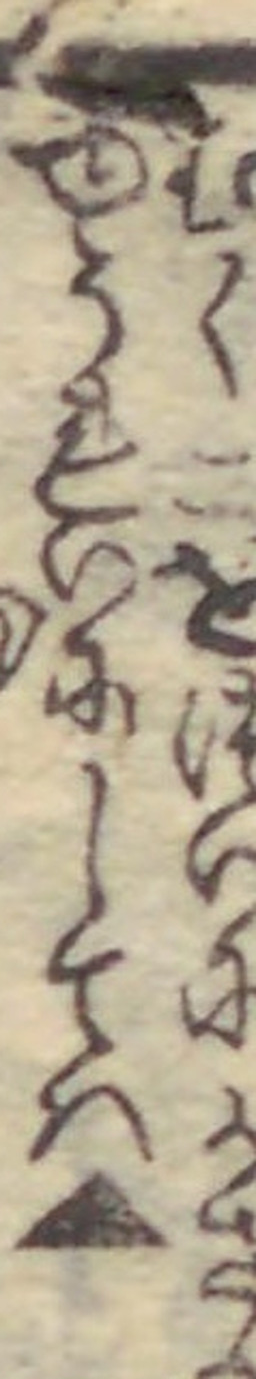ゆうれいにしては▲
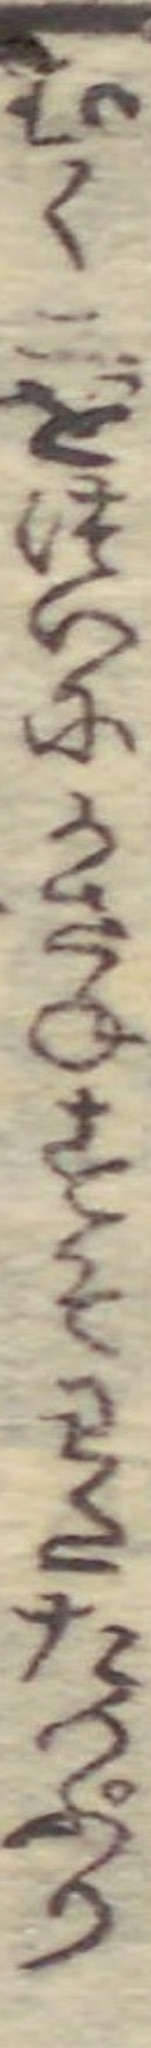むく二つをついにかさねすそわたたつぷり
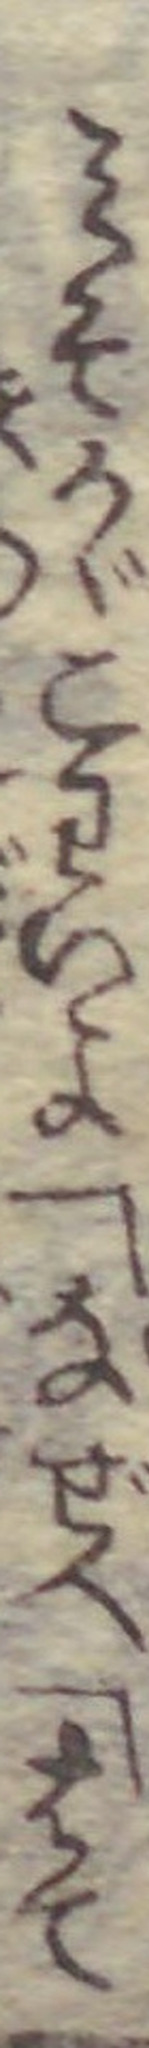みそかゞこわいよ〽なぜへ〽はて
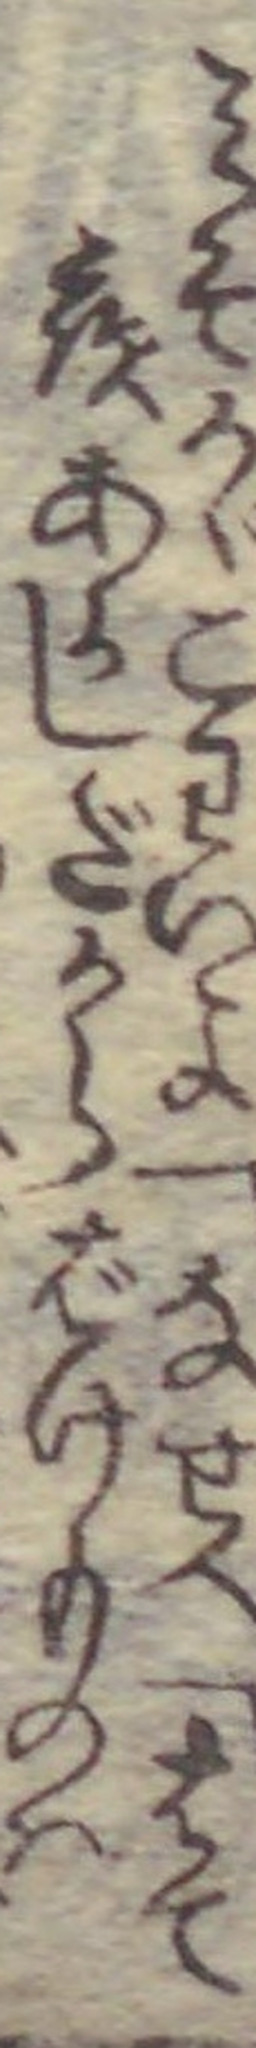夜あかしだからばけものは
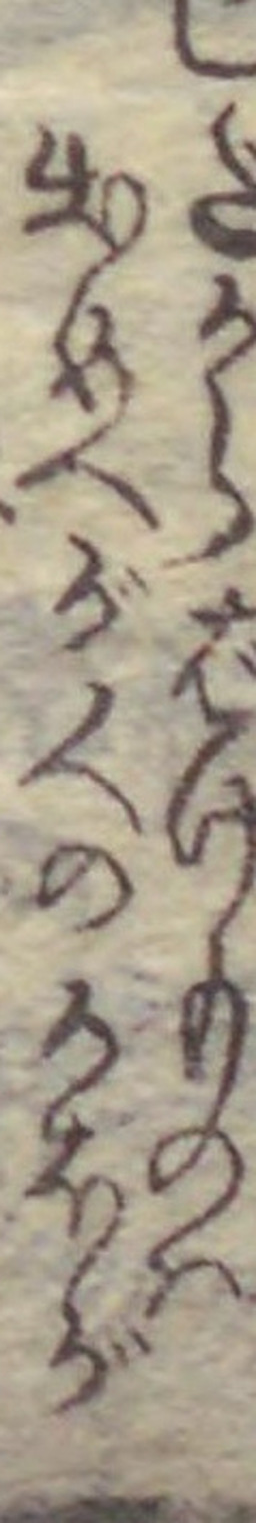出めへが人のかほが
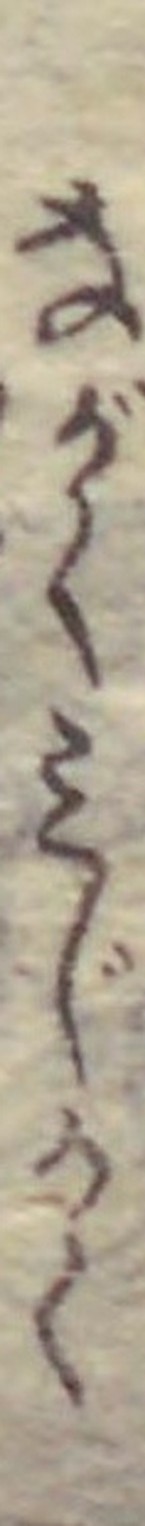ながくみじかく
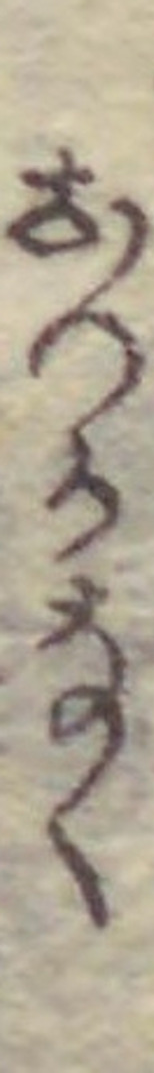おつかなく
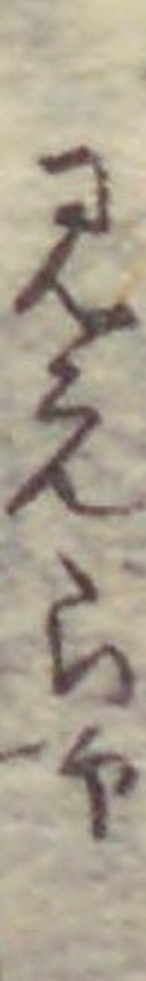見えらァ
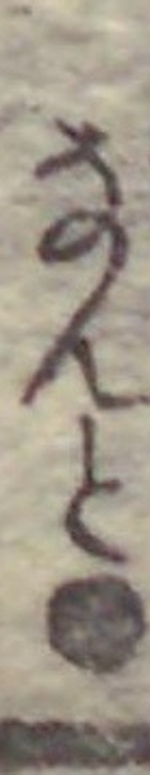なんと●
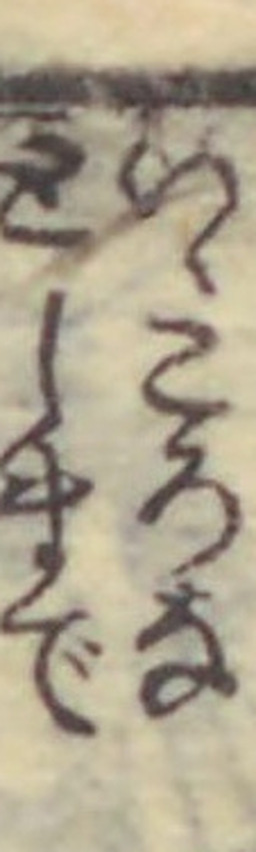としまで
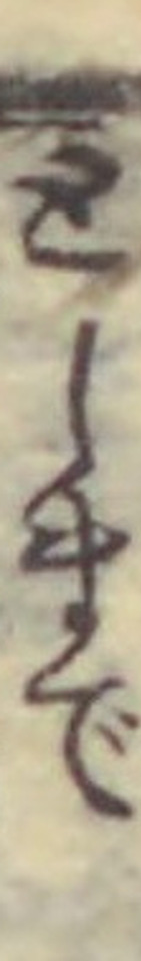としまで
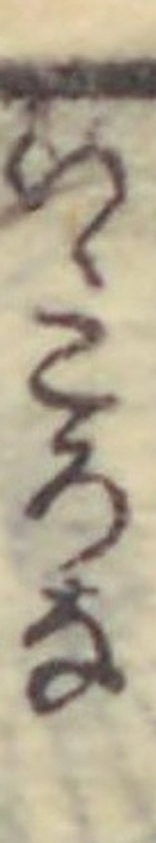いゝころな
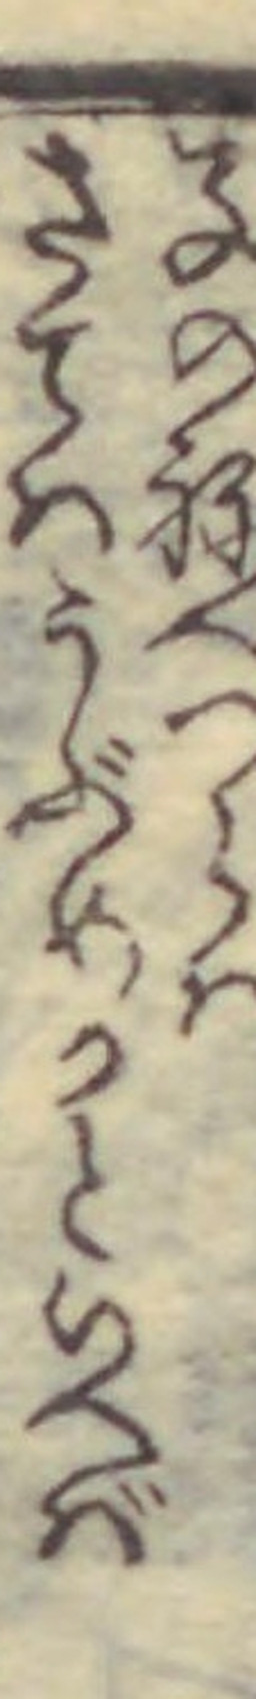さてはうぶめかといへば
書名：大時代唐土化物 3巻. 曽我太夫染
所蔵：国立国会図書館 National Diet Library, JAPAN
